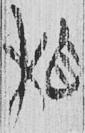相
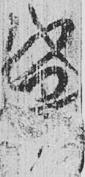好
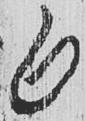㠯（以）
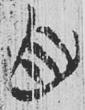自
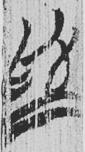爲
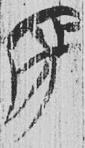○（長）
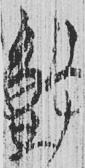○（愷）
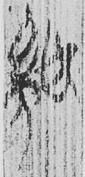○（豫）
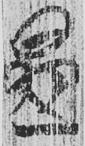是
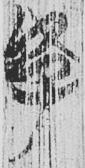好
